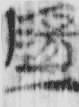○（陽）
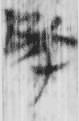年
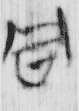同
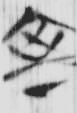室
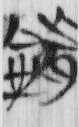鎆
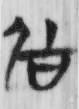居
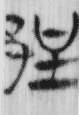郢
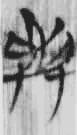與
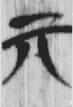亓（其）
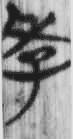季
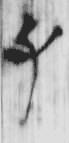父
